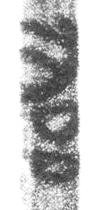囂
